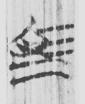馬
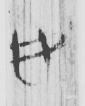女
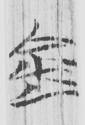金
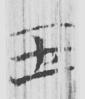玉
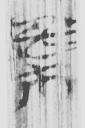㡀
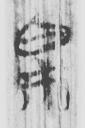帛
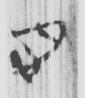名
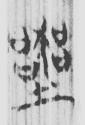{器土}
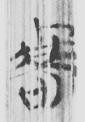{口甹}
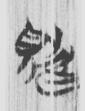{兆見}
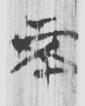不
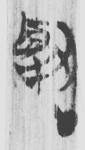解
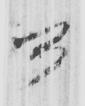乃
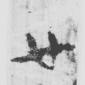廿
